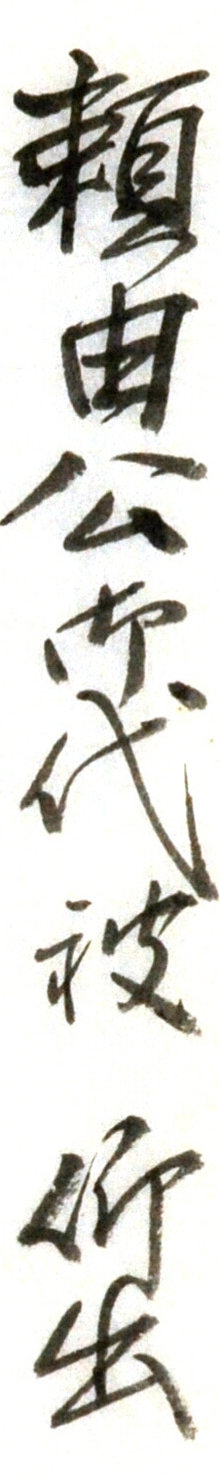頼由公御代被仰出
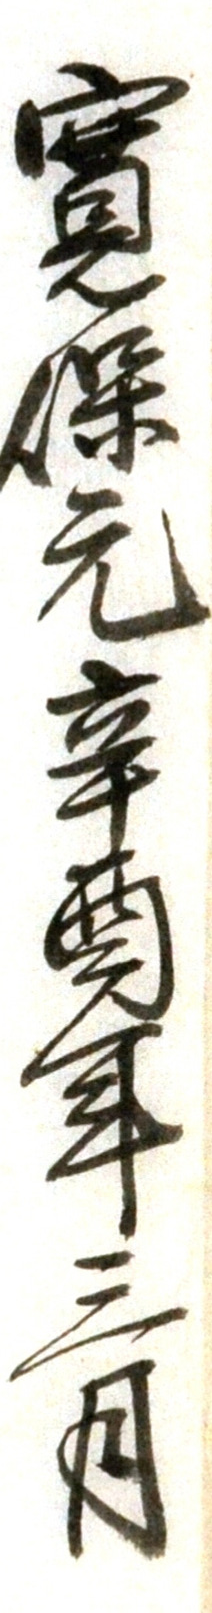寛保元辛酉年三月
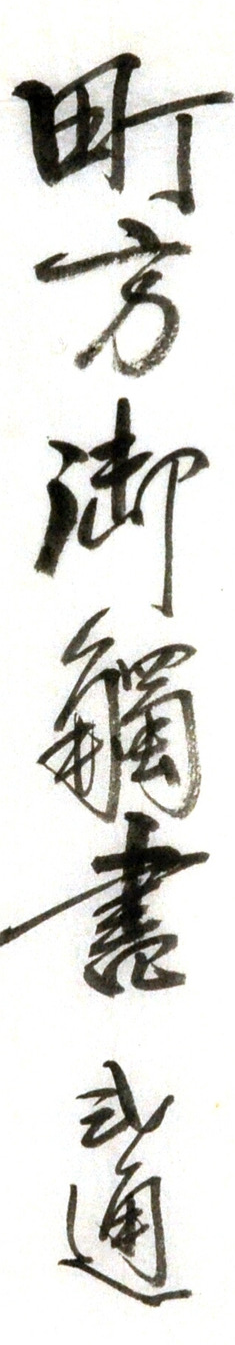町方御触書弐通

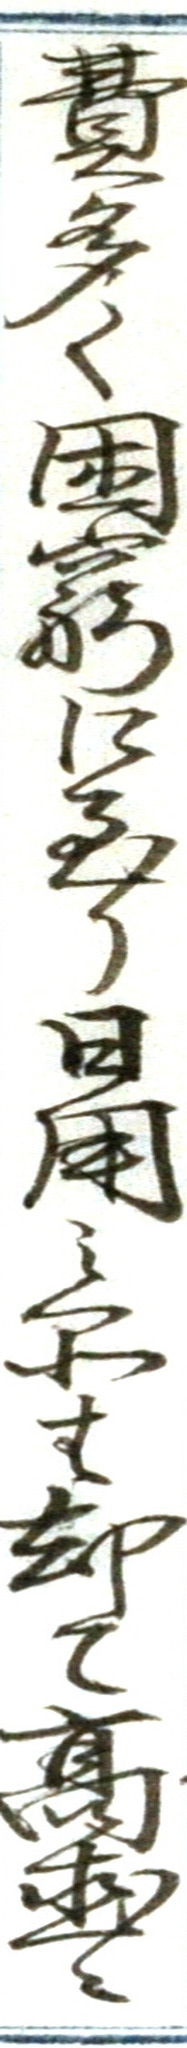費多く困窮に至り日用之品者却て高直ニ
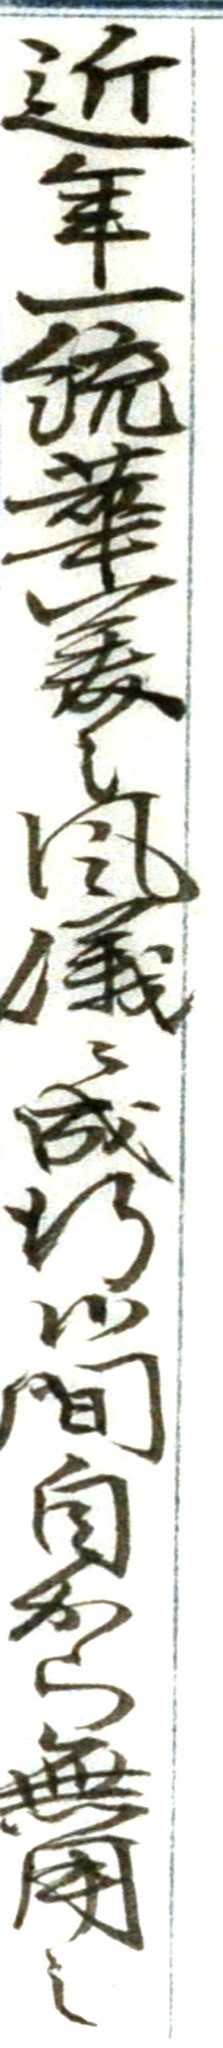近年一統華美之風儀ニ成行候間自から無用之
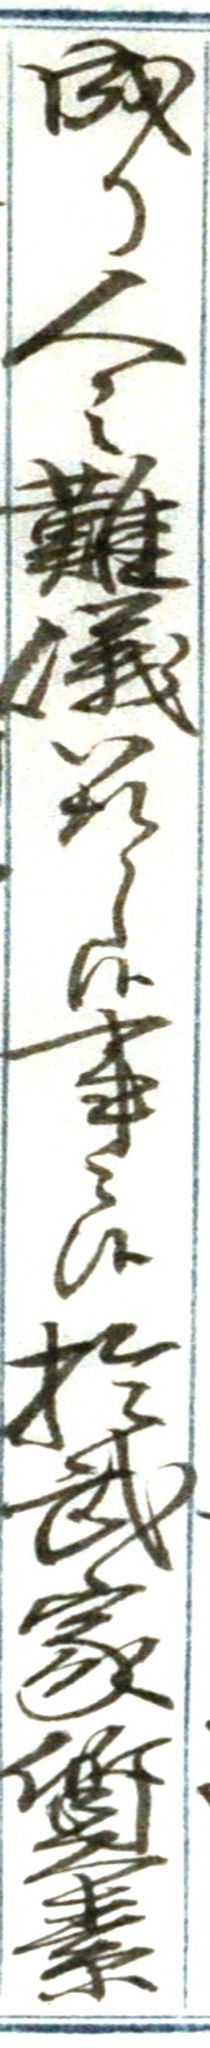成り人々難儀いたし候於武家質素
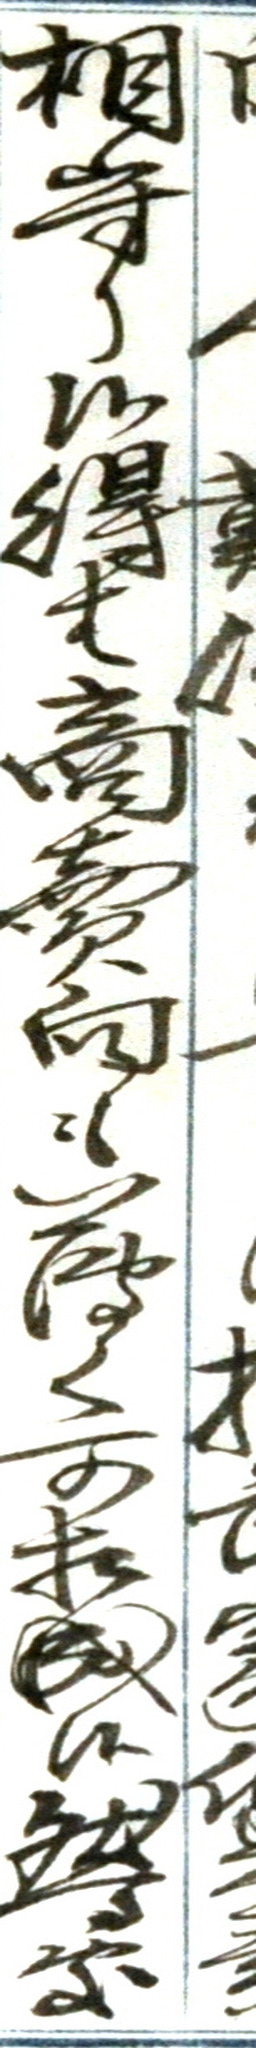相守り候得者商売向も薄く可相成候然る処
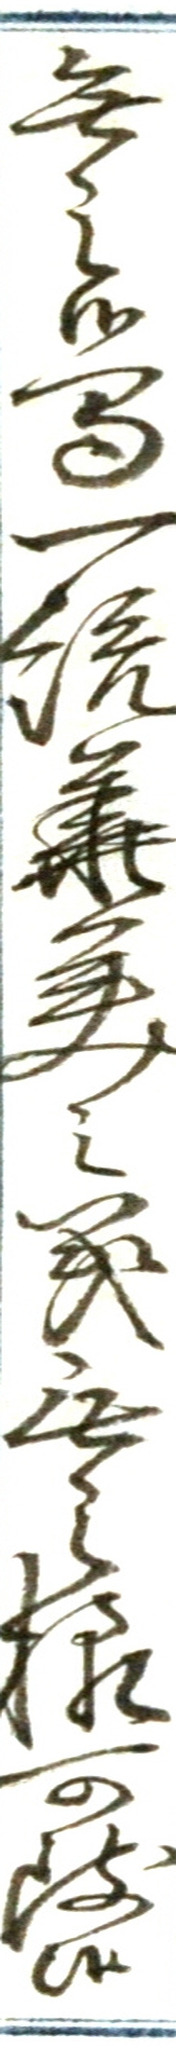無之候間一統華美之義無之様可致候
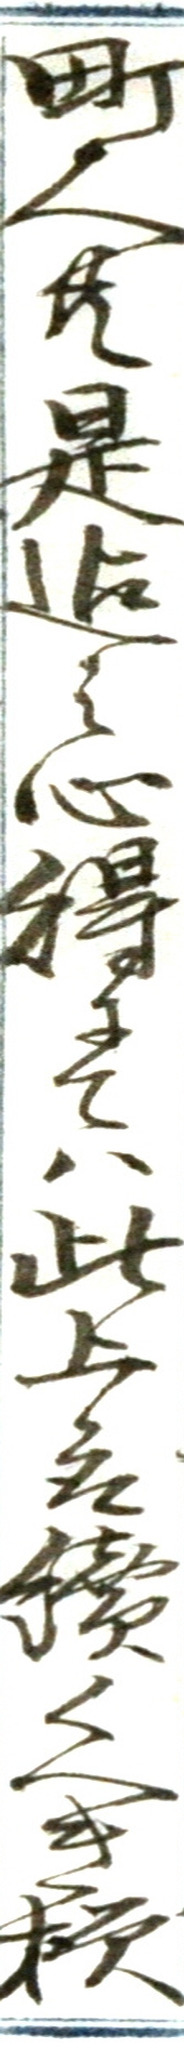町人共是迄之心得にてハ此上取続くへき様
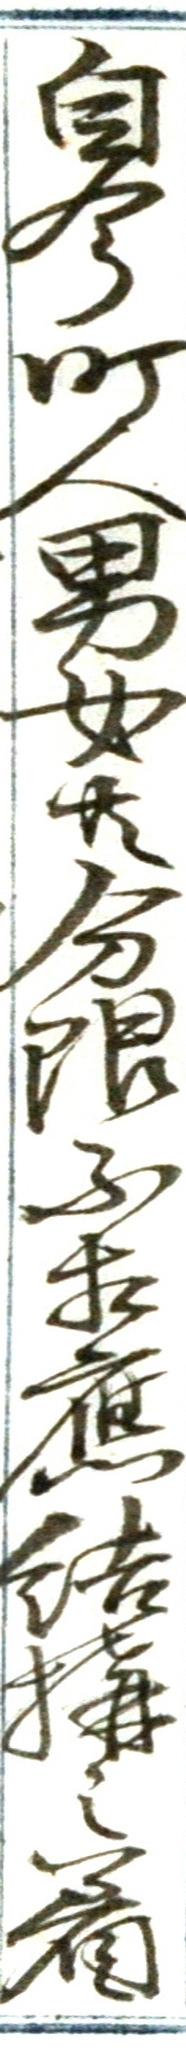自今町人男女共分限不相応結構之着
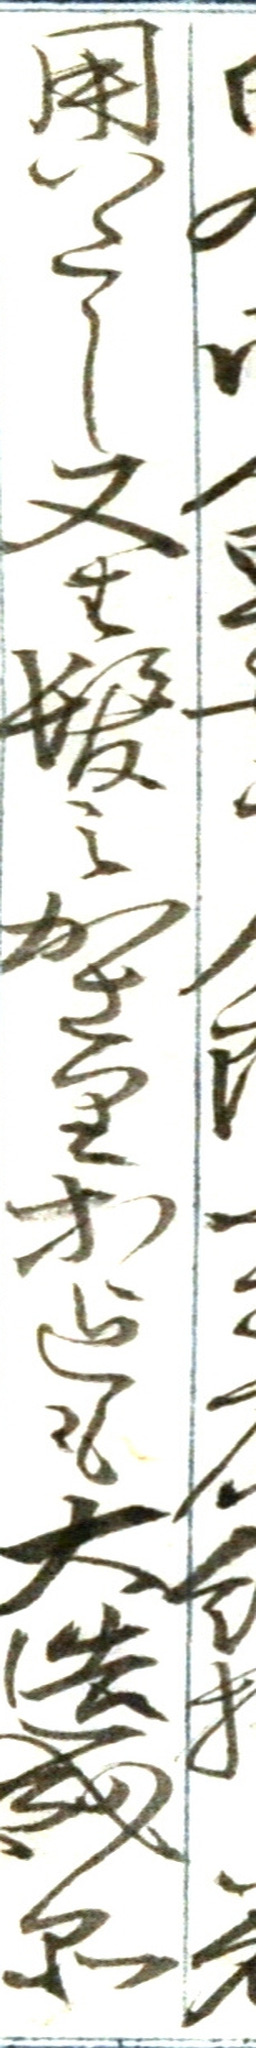用いたし又者髪之かさり等迄も大造成品
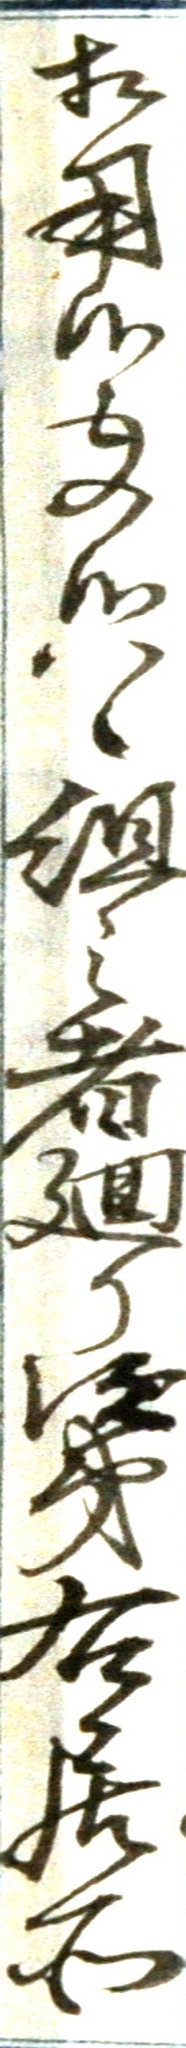相用候もの候ハゝ組之者廻り次第右居所

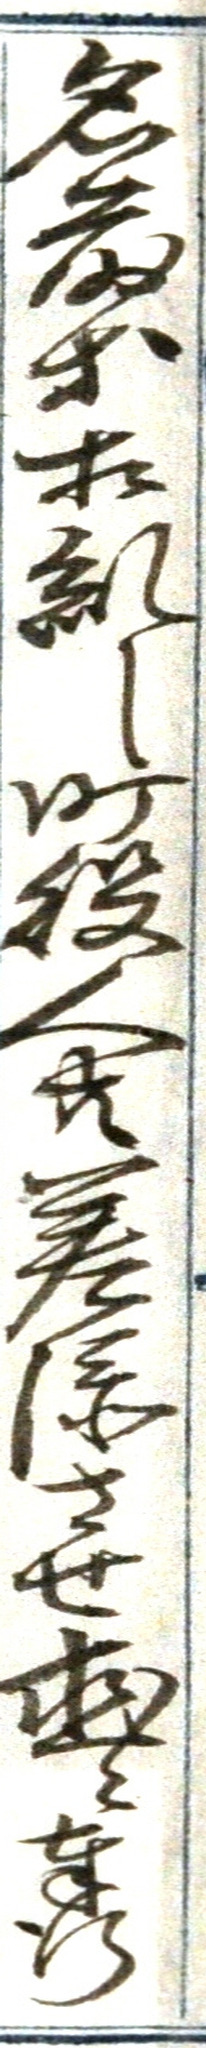名前等相糺し町役人共差添させ直々奉行
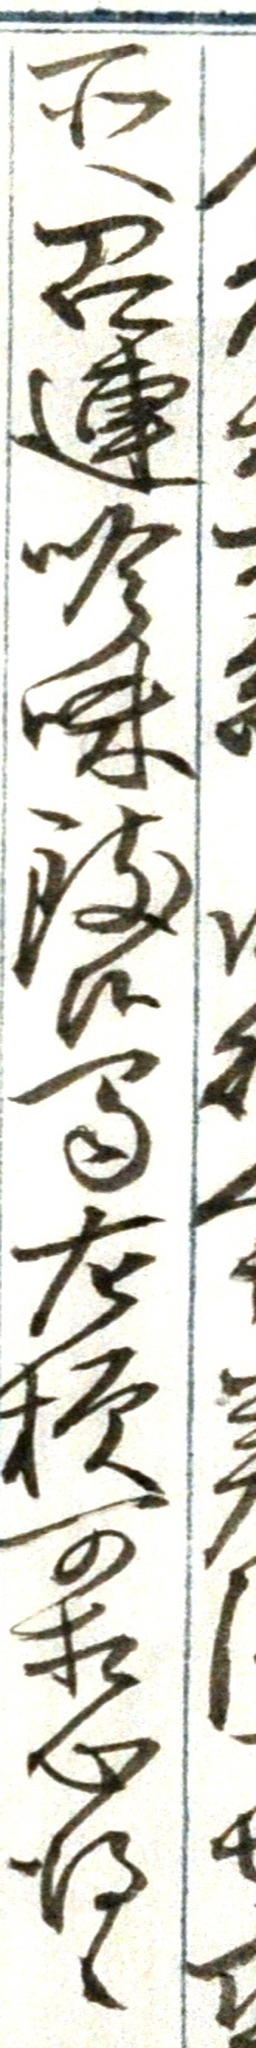所へ召連吟味致候間左様可相心得候
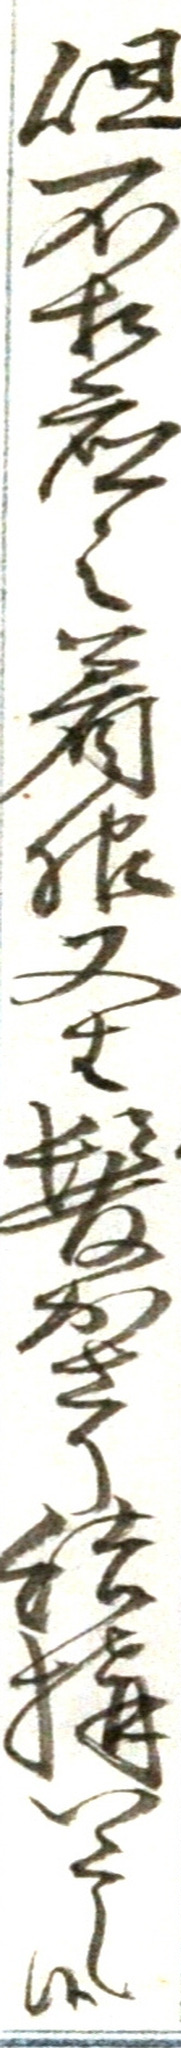但不相応之着服又者髪かさり結構いたし候
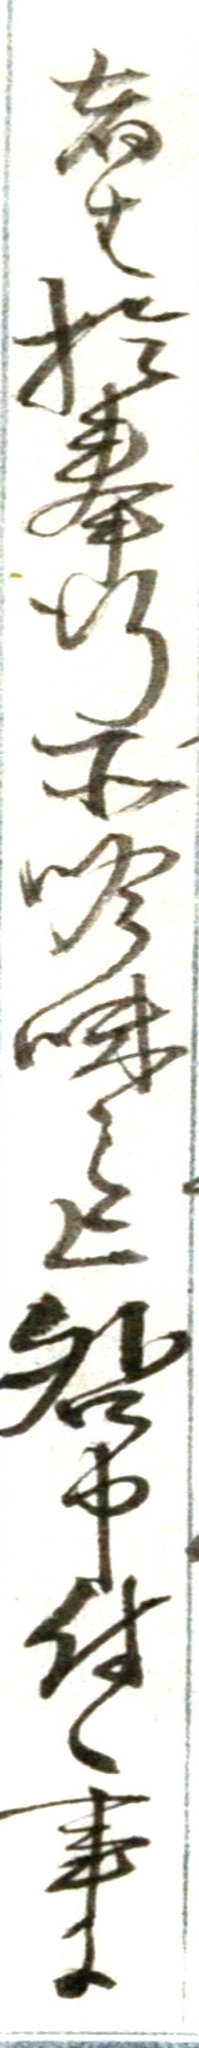者者於奉行所吟味之上咎申付候事に
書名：町方御触書・二通
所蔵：伊那市立高遠町図書館・合同会社AMANE
